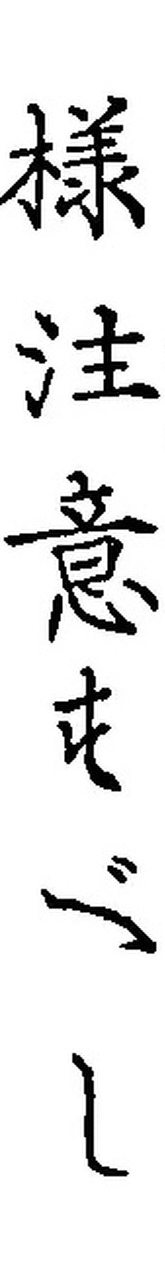様注意すべし
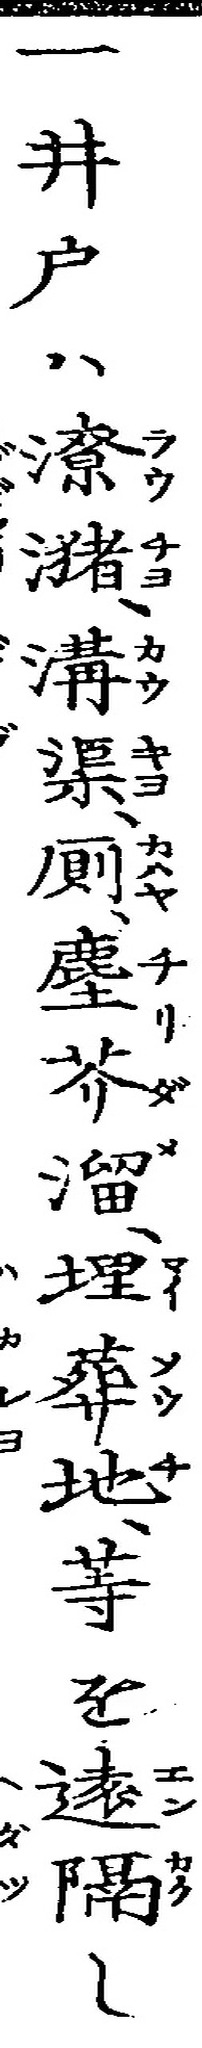一井戸は潦潴、溝渠、厠、塵芥溜、埋葬地、等を遠隔し
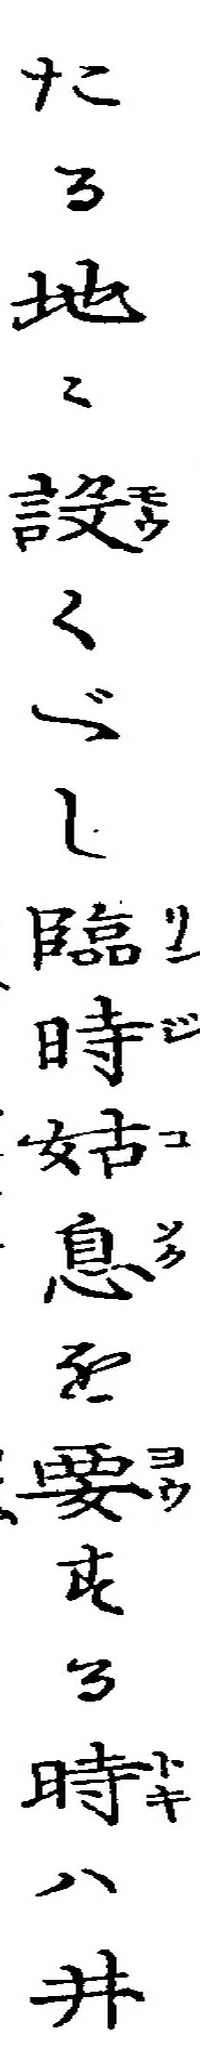たる地に設くべし臨時姑息を要する時は井
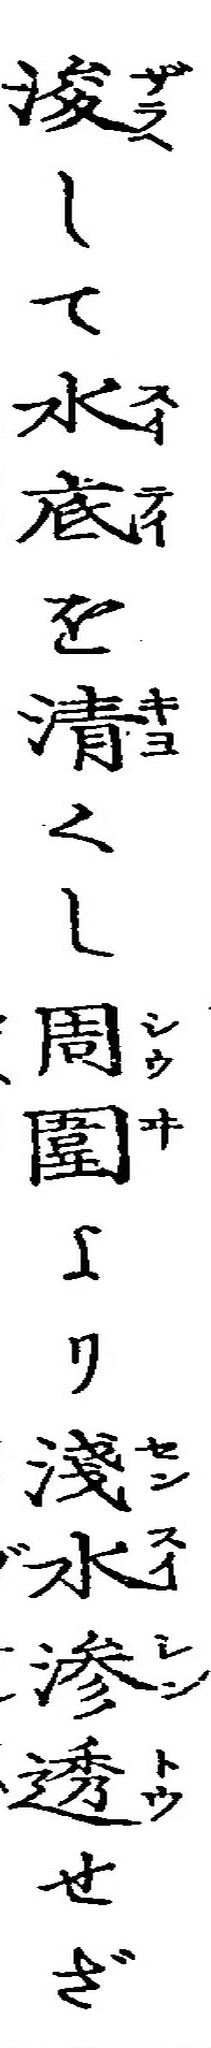浚して水底を清くし周囲より浅水滲透せざ

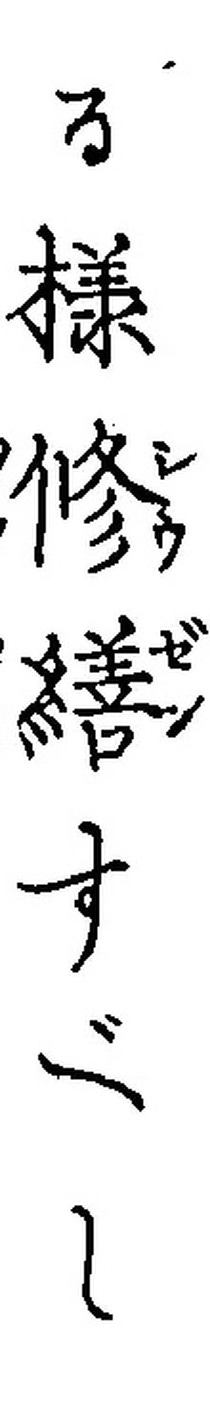る様修繕すべし
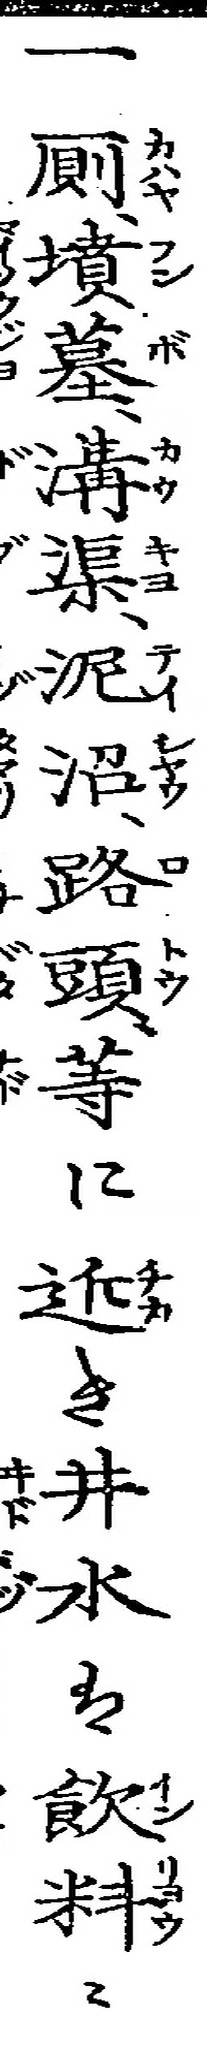一厠、墳墓、溝渠、泥沼、路頭、等に近き井水は飲料に
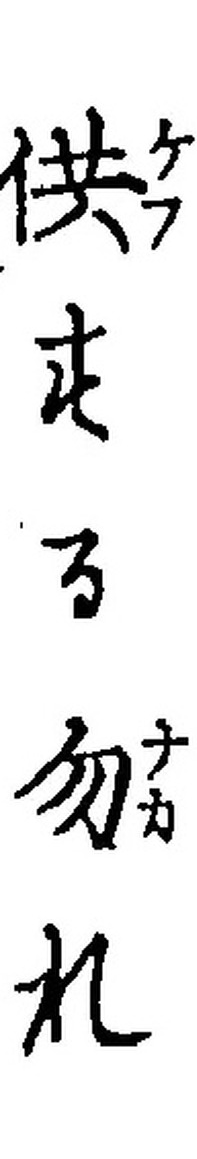供する勿れ
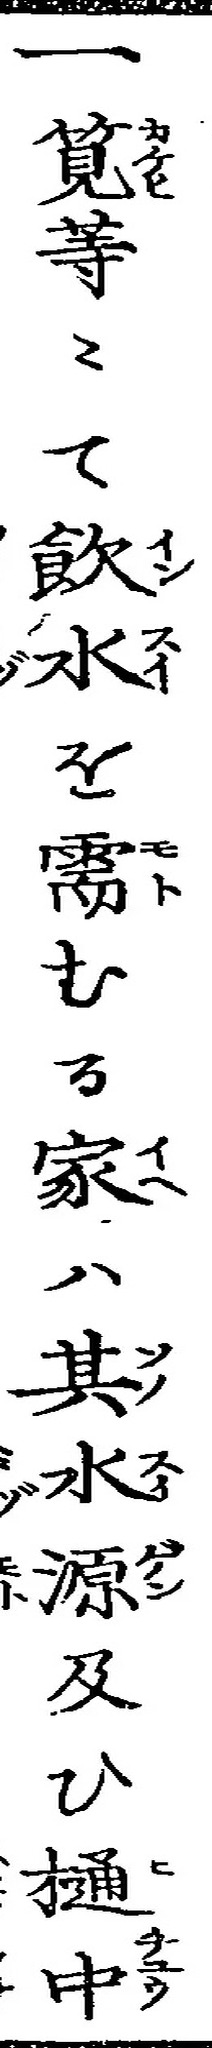一筧等にて飲水を需むる家は其水源及ひ樋中
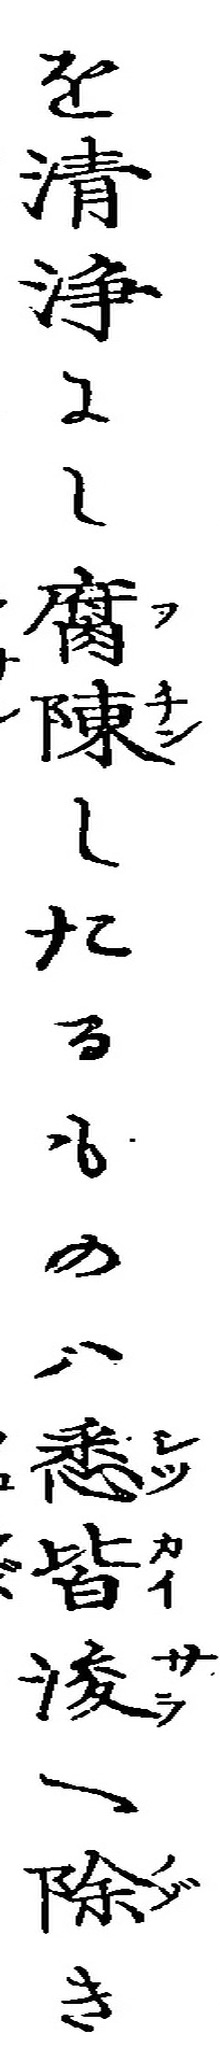を清浄にし腐陳したるものは悉皆浚へ除き
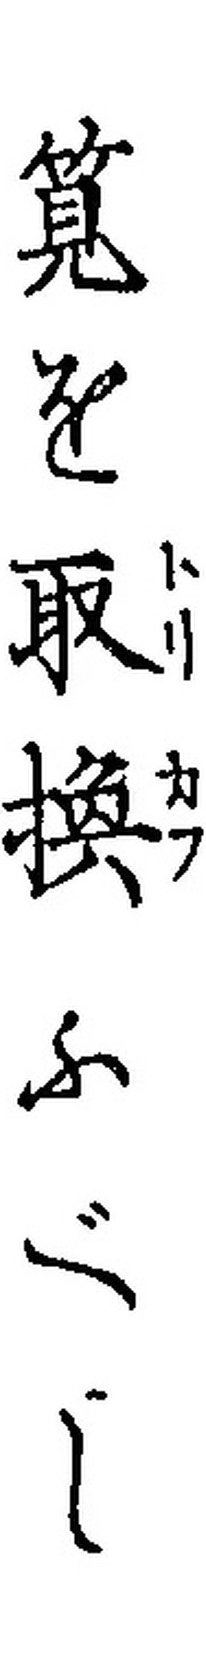筧を取換ふべし
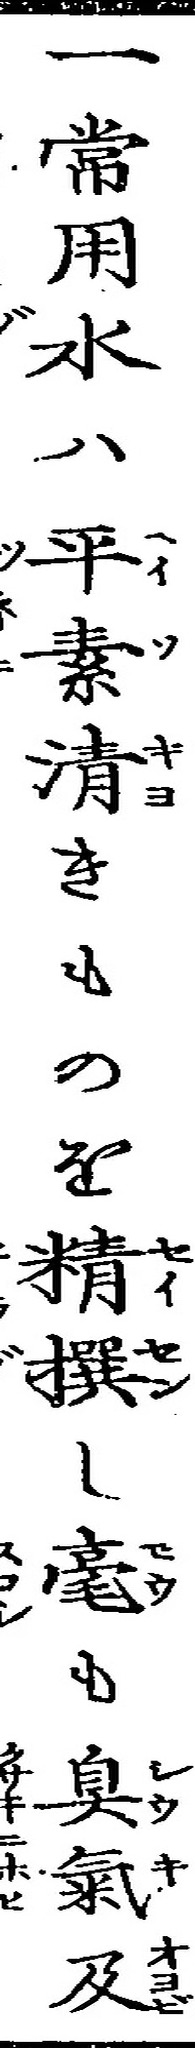一常用水は平素清きものを精撰し毫も臭気及
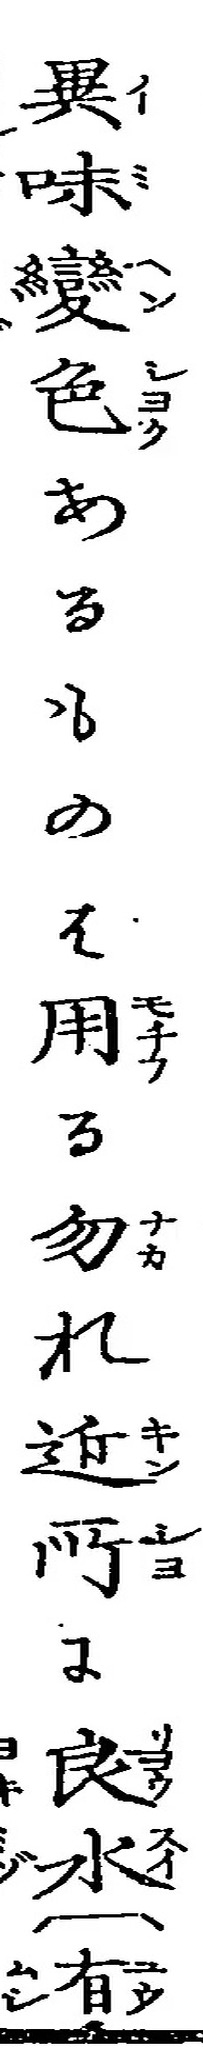異味変色あるものは用る勿れ近所に良水[有
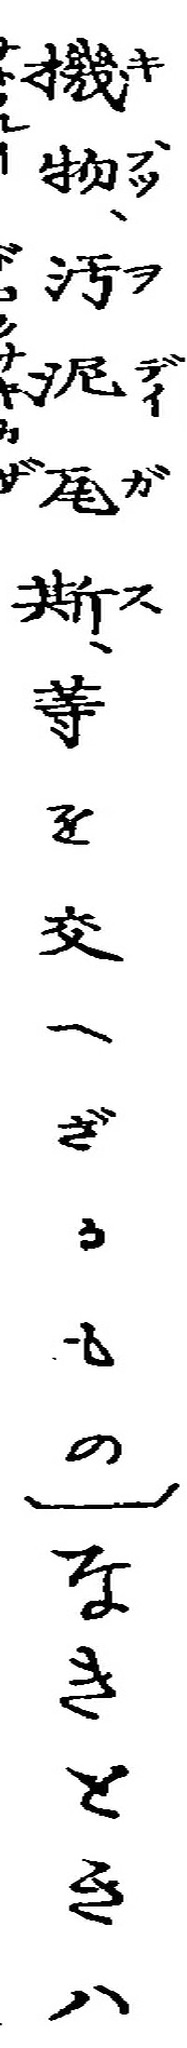機物汚泥瓦斯、等を交へざるもの]なきときは
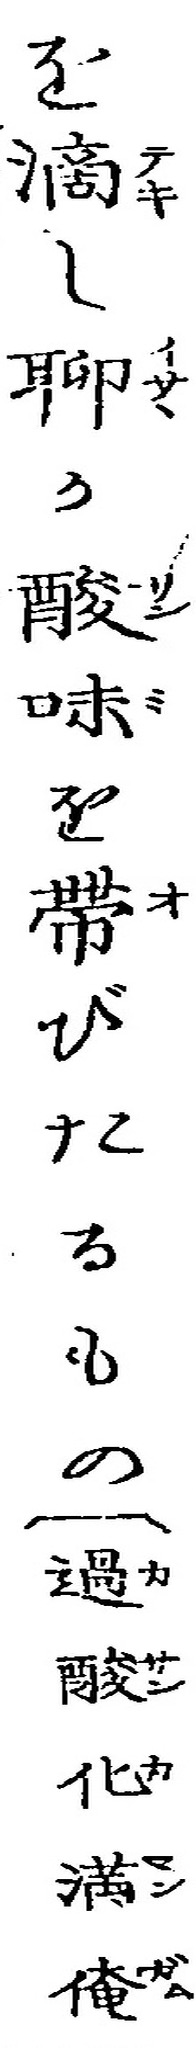を滴し聊か酸味を帯びたるもの[過酸化満俺
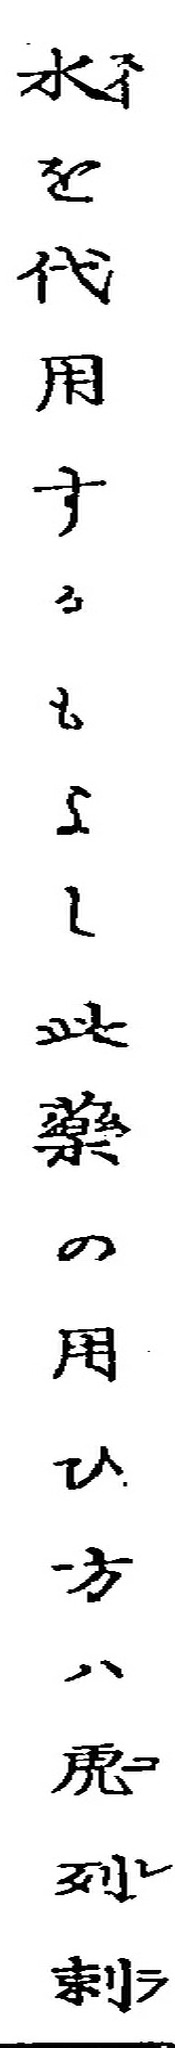水を代用するもよし此藥の用ひ方は虎列刺
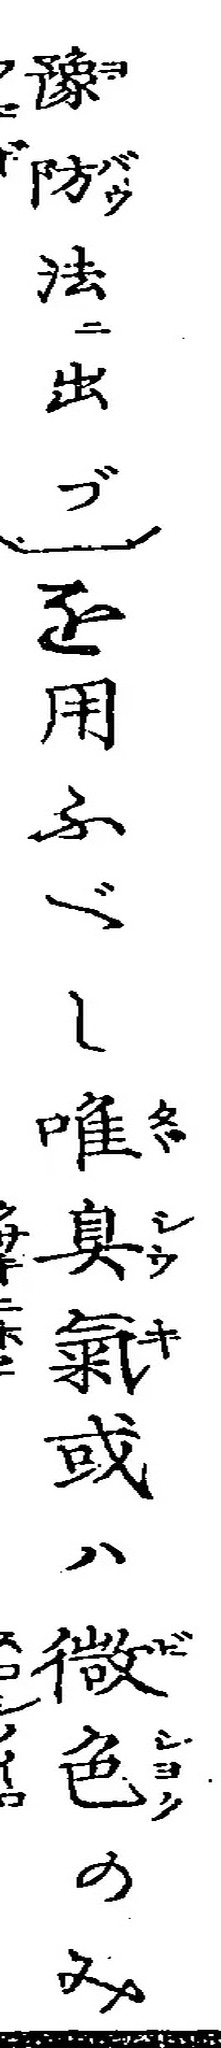予防法に出づ]を用ふべし唯臭気或は微色のみ
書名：伝染病予防法
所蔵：国立国会図書館 National Diet Library, JAPAN
